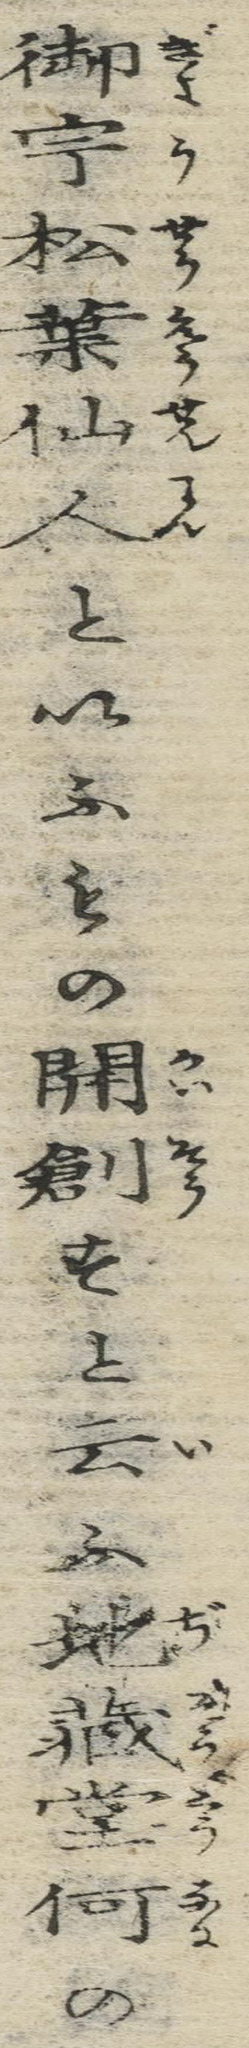御宇松葉仙人といふもの開創すと云ふ地蔵堂何の
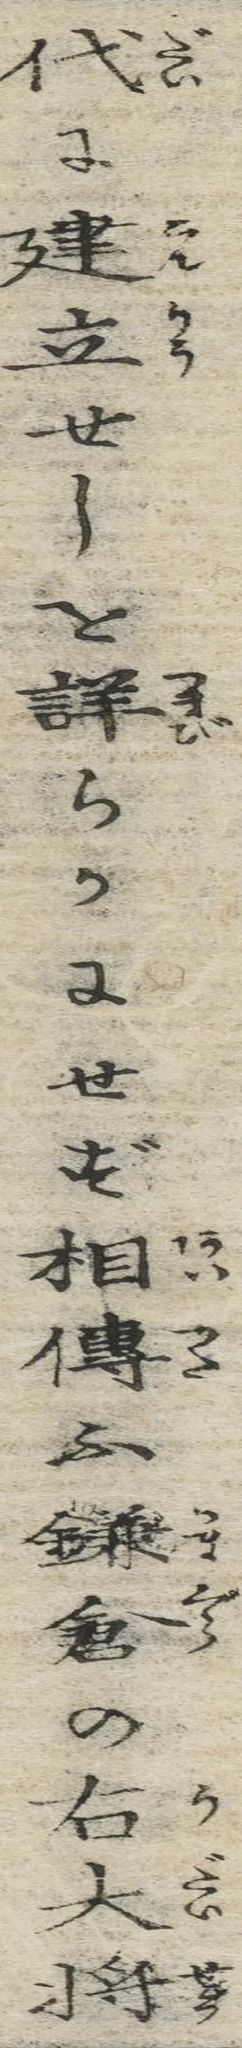代に建立せしを詳らかにせず相伝ふ鎌倉の右大将
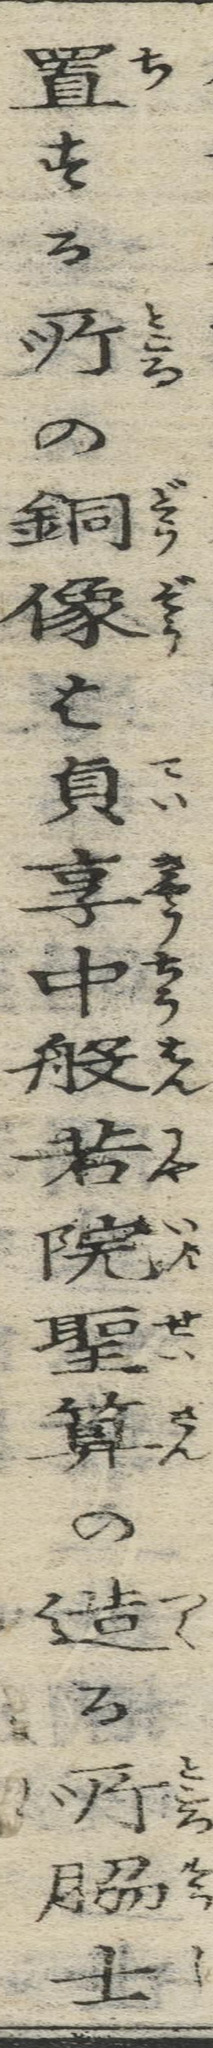置する所の銅像は貞享中般若院聖算の造る所脇士
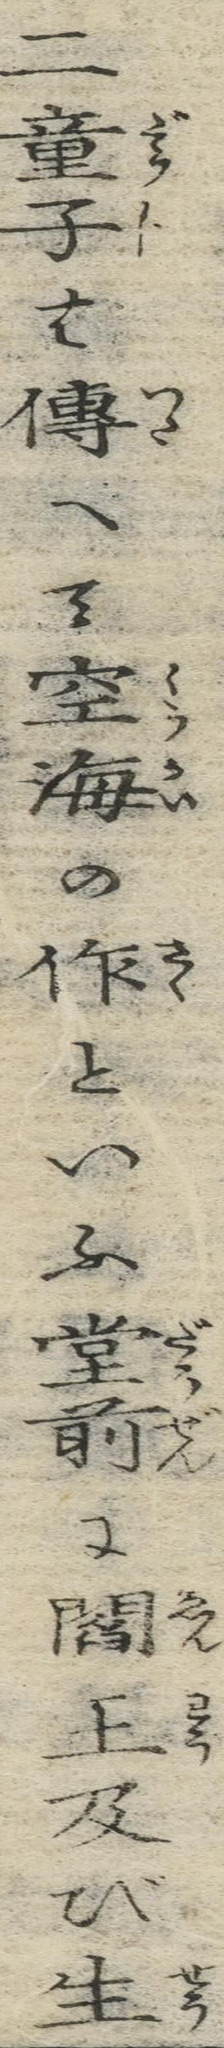二童子は伝へて空海の作といふ堂前に閻王及び生
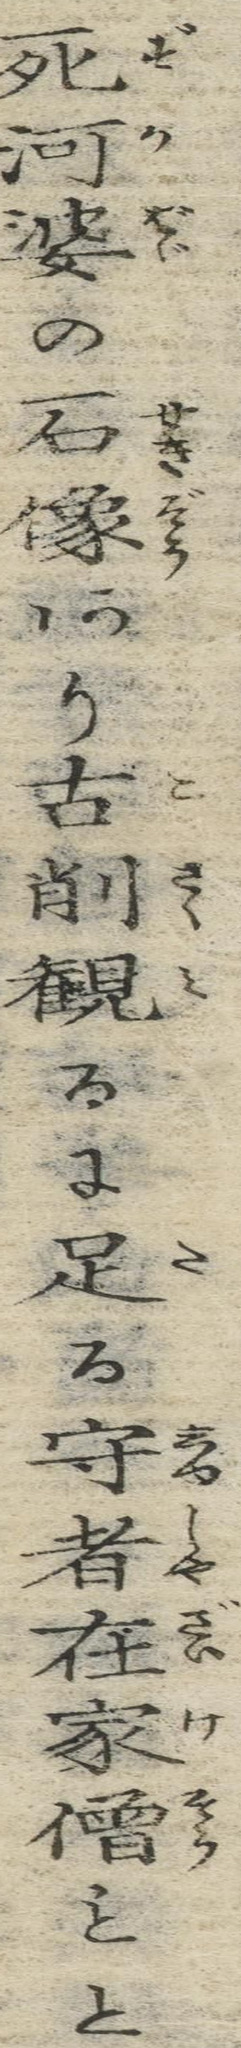死河婆の石像あり古削観るに足る守者在家僧もと

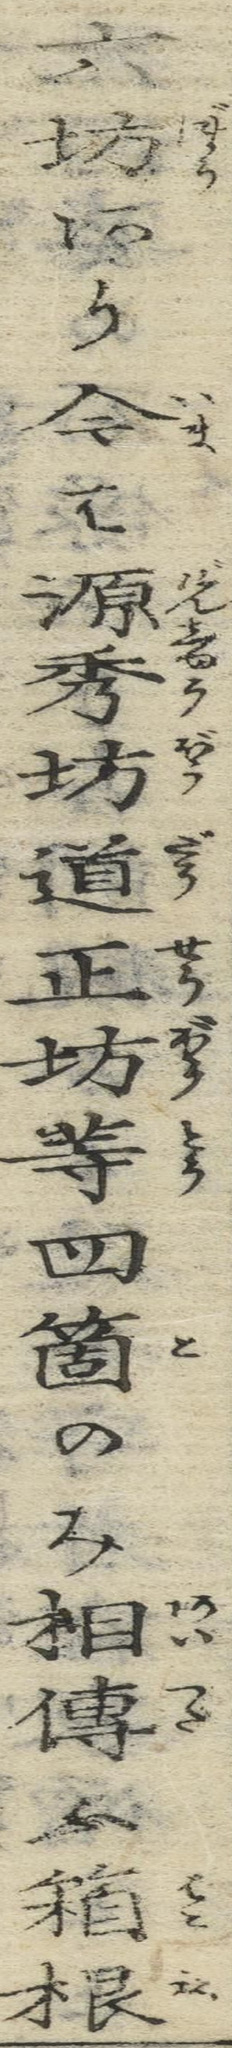六坊あり今は源秀坊道正坊等四箇のみ相伝ふ箱根
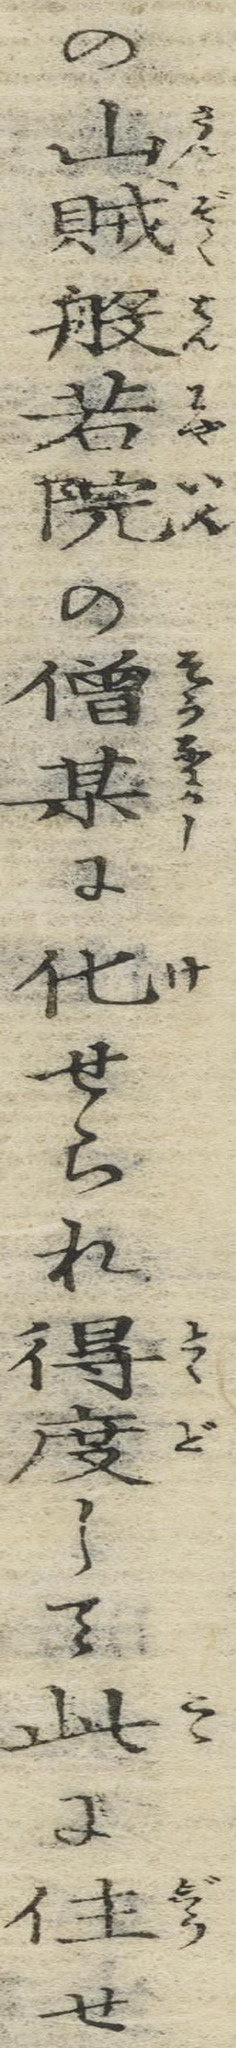の山賊般若院の僧某に化せられ得度して此に住せ
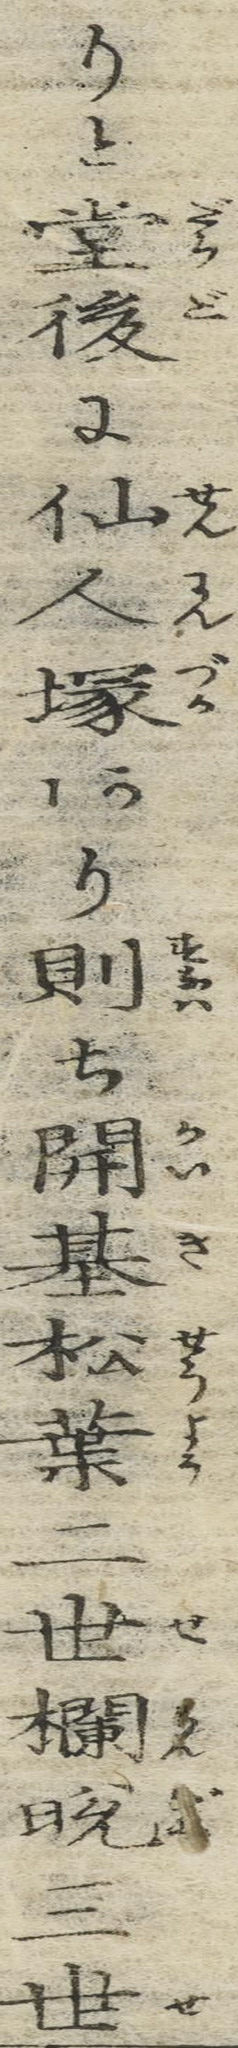りと堂後に仙人塚あり則ち開基松葉二世欄脱三世
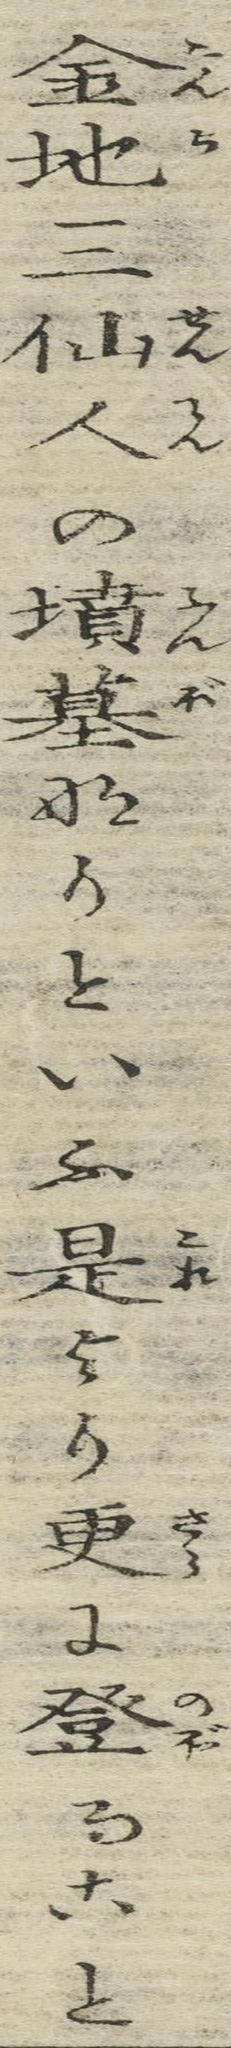金地三仙人の墳墓なりといふ是より更に登ること
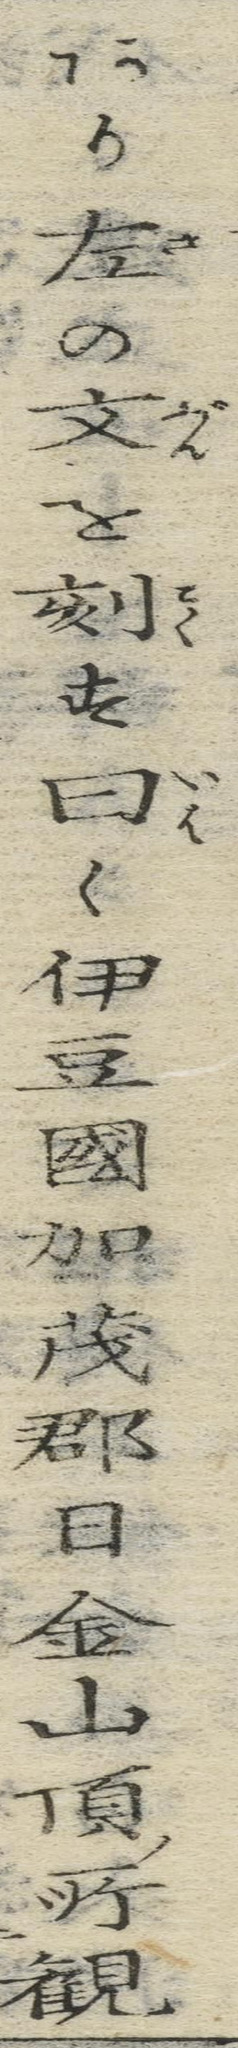あり左の文を刻す曰く伊豆国加茂郡日金山頂所観
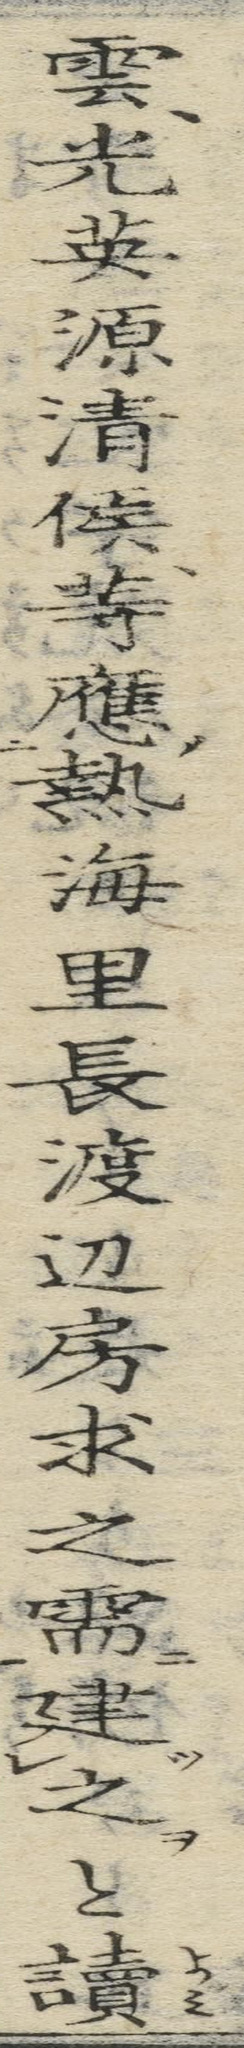雲、光英源清侯、等応〆熱海里長渡辺房求之需二建之読
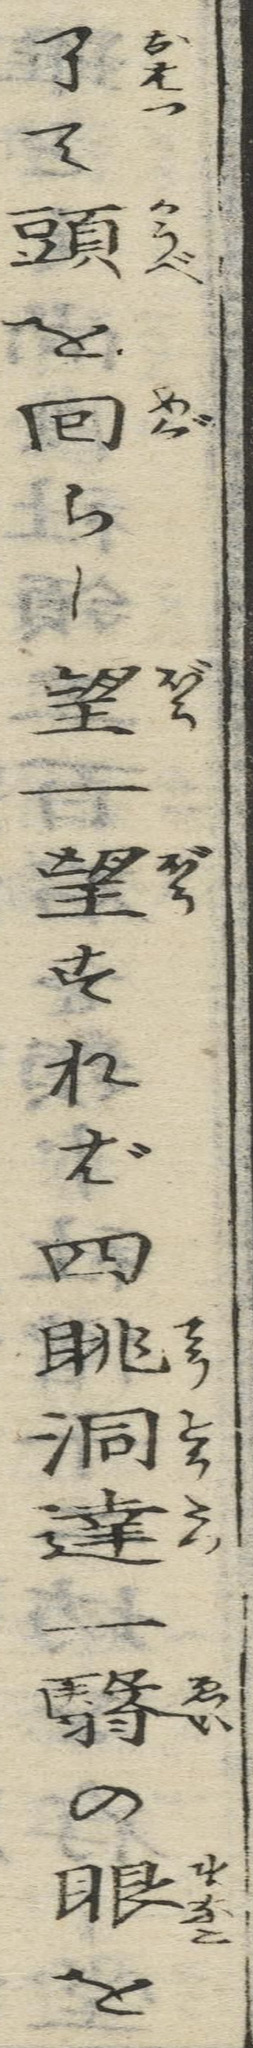了て頭を回らし望一望すれば四眺洞達一翳の眼を
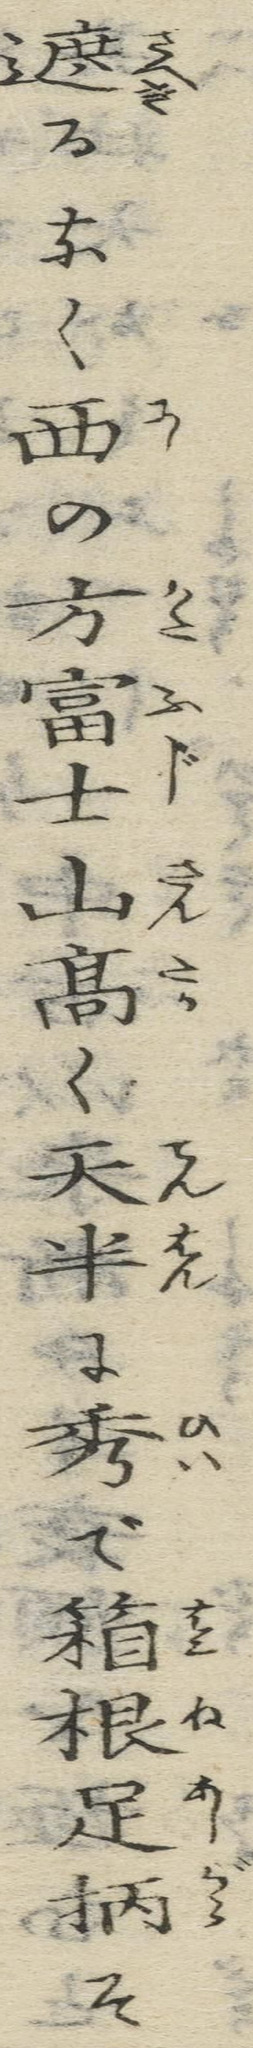遮るなく西の方富士山高く天半に秀で箱根足柄そ
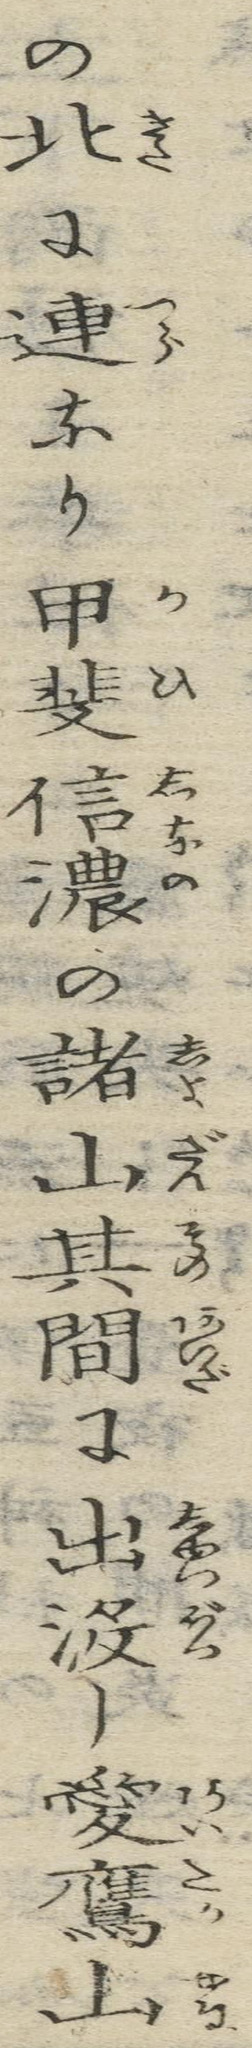の北に連なり甲斐信濃の諸山其間に出没し愛鷹山
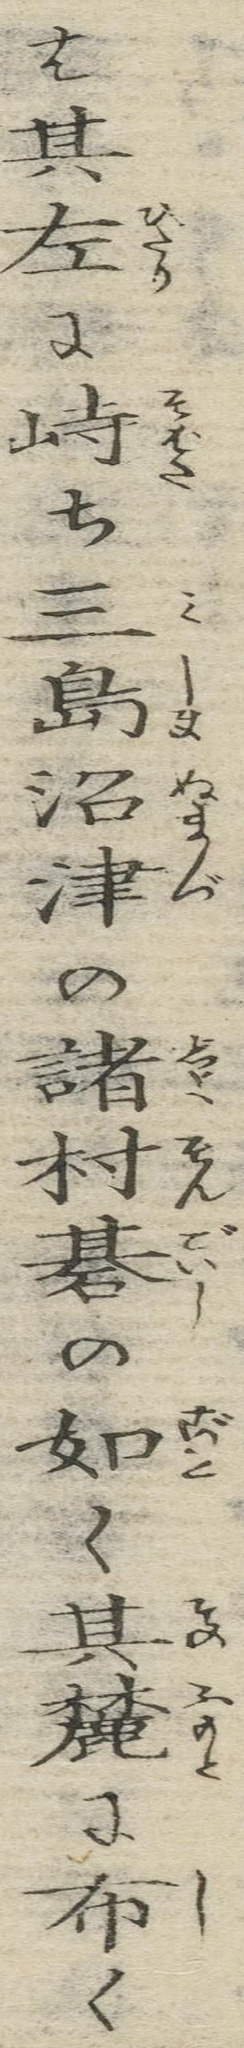は其左に峙ち三島沼津の諸村碁の如く其麓に布く
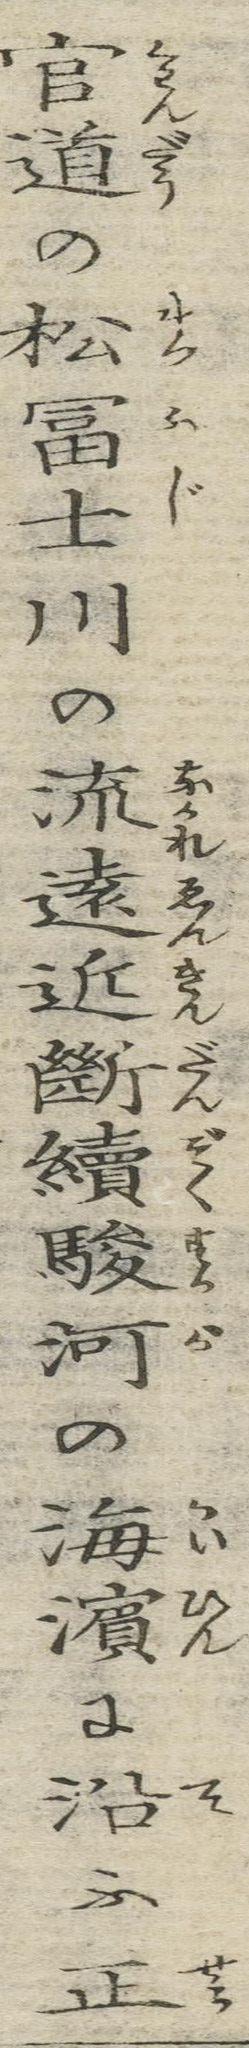官道の松富士川の流遠近断続駿河の海浜に沿ふ正
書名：豆州熱海誌　完
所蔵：東京大学地震研究所図書室 Earthquake Research Institute Library, The University of Tokyo, JAPAN
